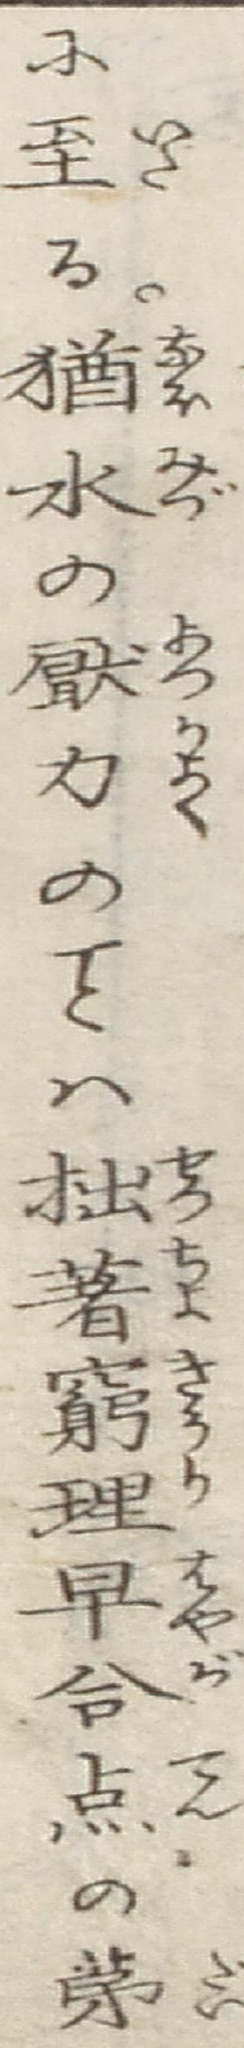に至る。猶水の圧力のことは拙著窮理早合点の第
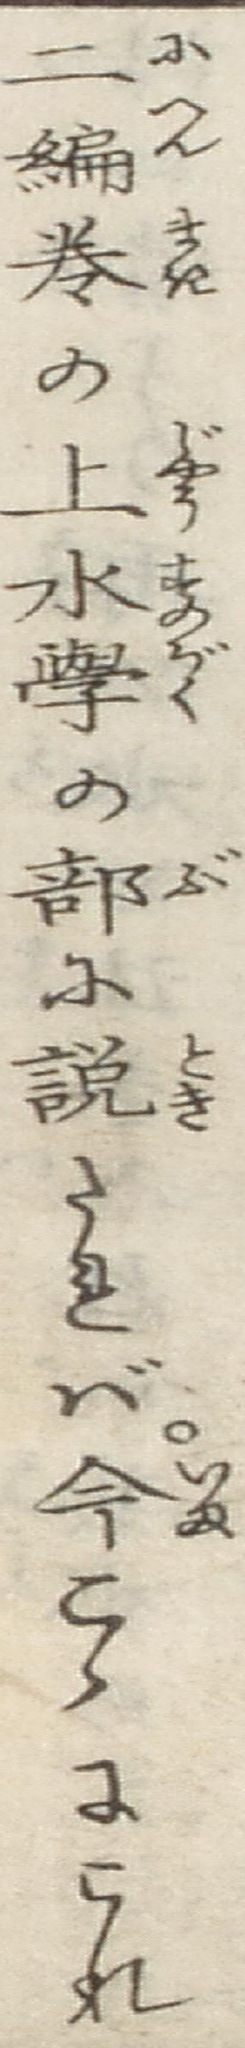二編巻の上水学の部に説たれば。今こゝにこれ
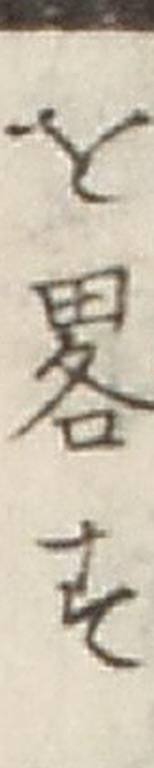を略す
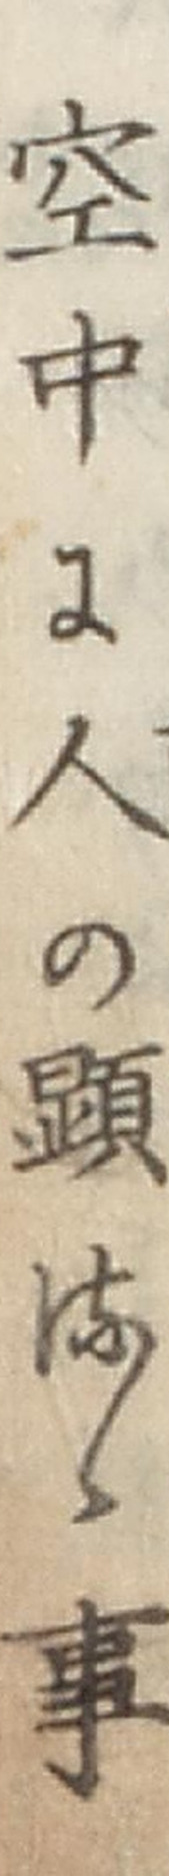空中に人の顕るゝ事
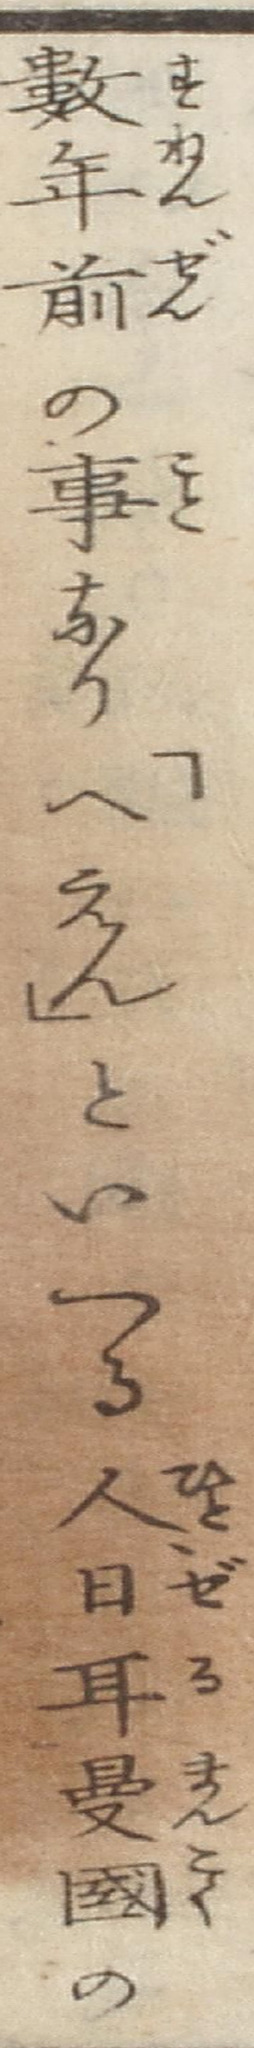数年前の事なり「へえん」といへる人、日耳曼国の
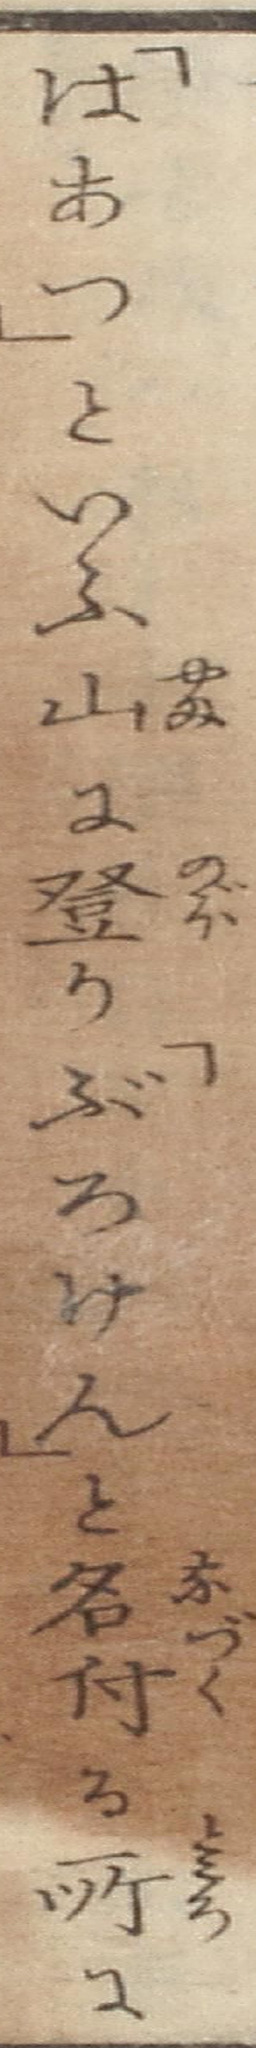「はあつ」といふ山に登り「ぶろけん」と名付る所に
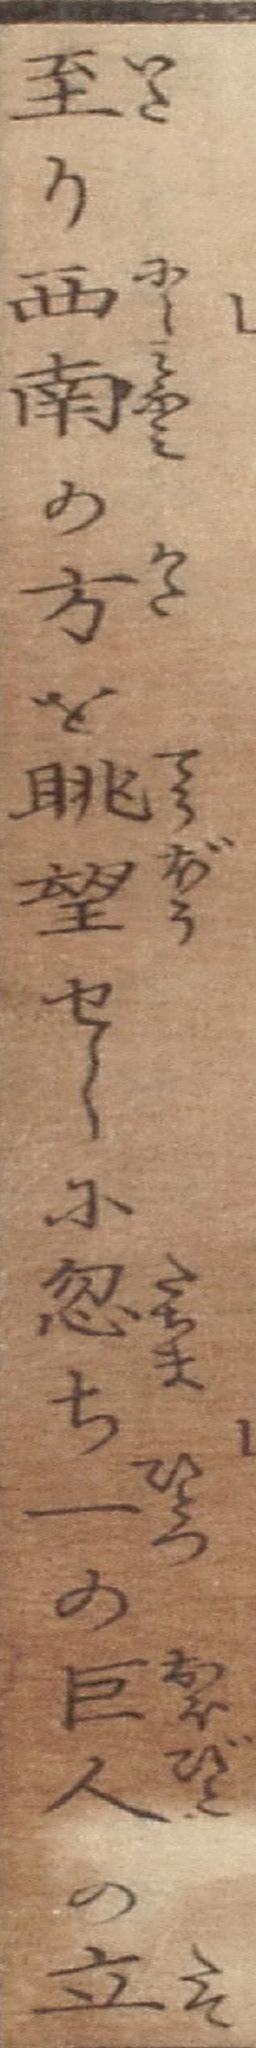至り西南の方を眺望せしに忽ち一の巨人の立
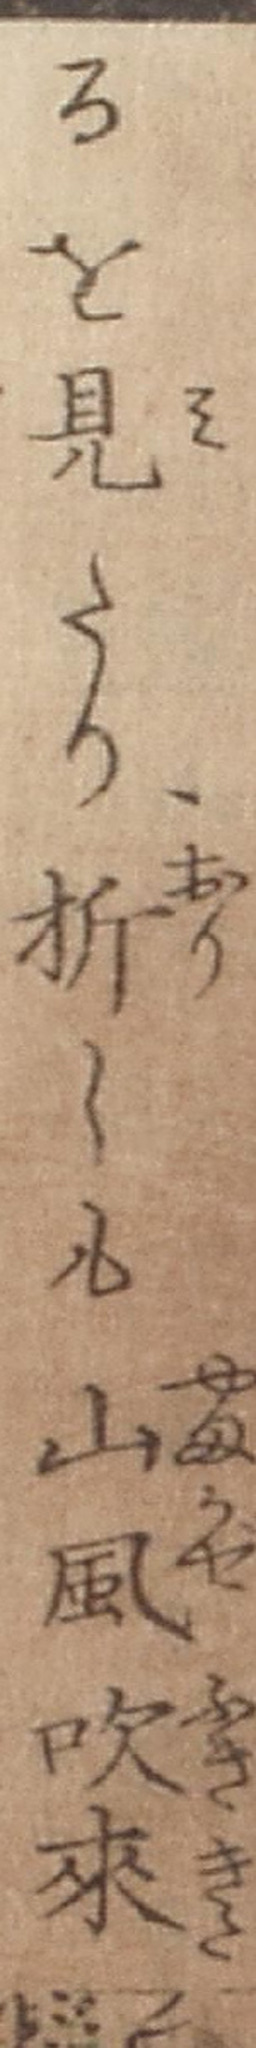るを見たり、折しも山風吹来
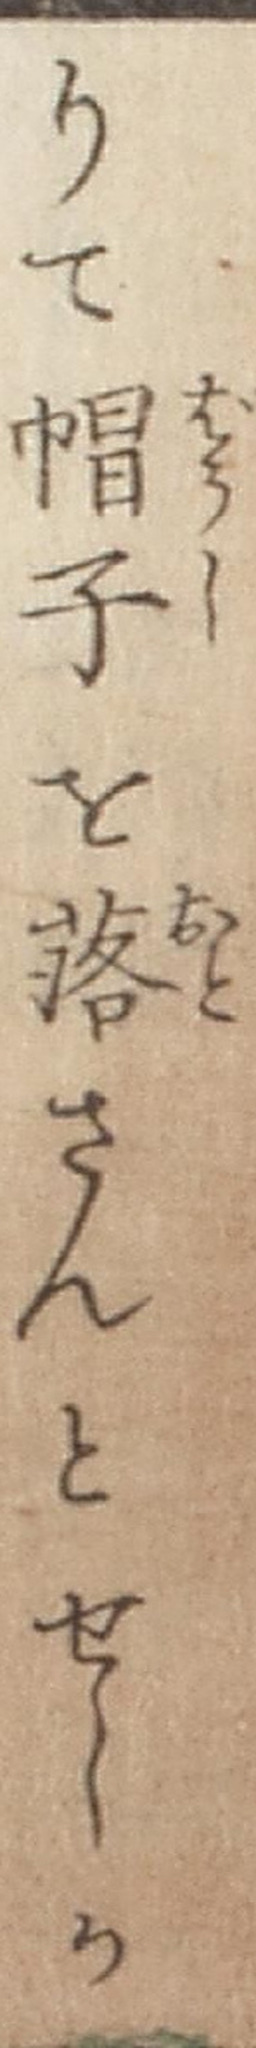りて帽子を落さんとせしか
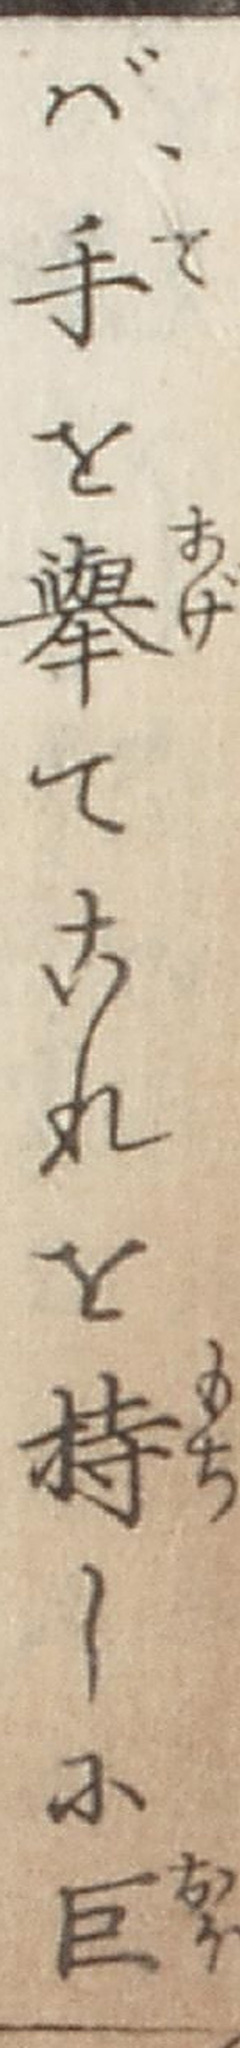ば、手を挙てこれを持しに巨
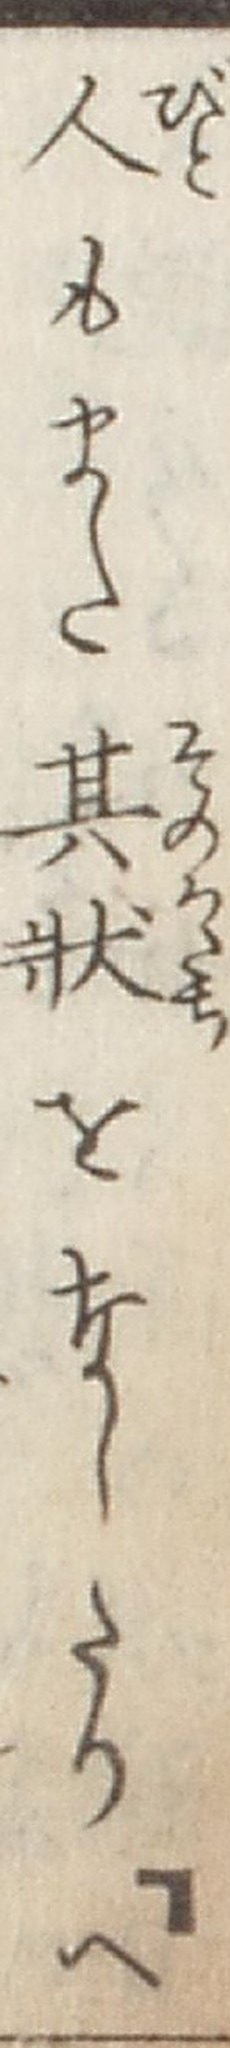人もまた其状をなしたり「へ
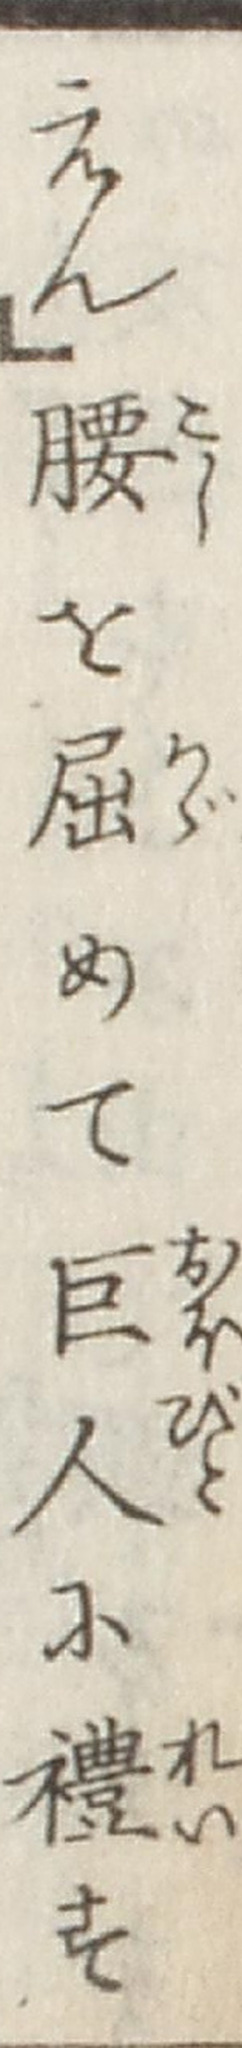えん」腰を屈めて巨人に礼す
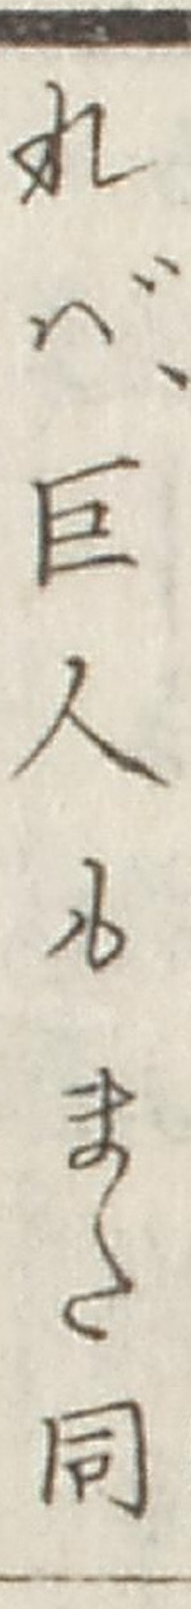れば、巨人もまた同
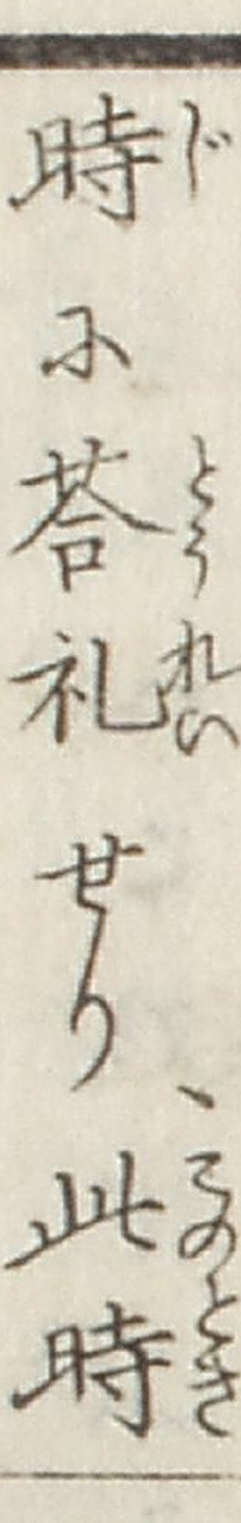時に答礼せり、此時
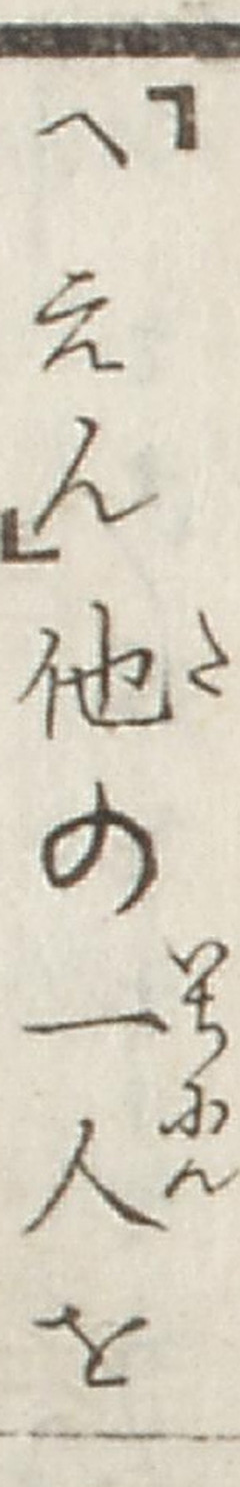「へえん」他の一人を
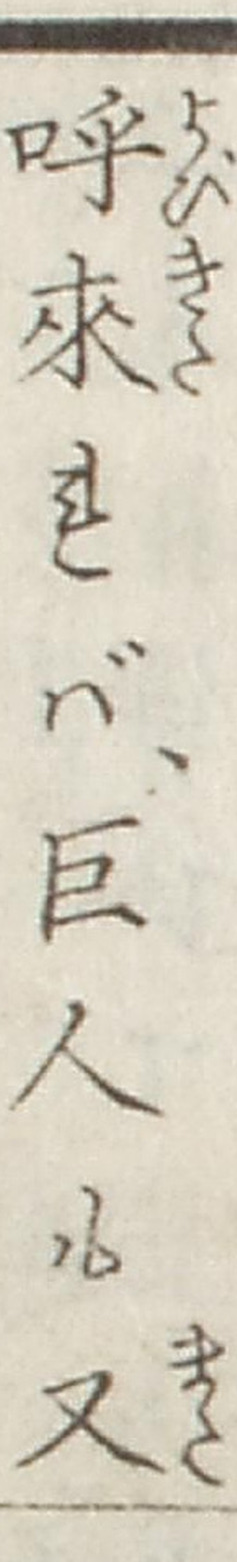呼来れば、巨人も又
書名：変異辯　一名、天變地異拾遺　全
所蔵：東京大学地震研究所図書室 Earthquake Research Institute Library, The University of Tokyo, JAPAN
